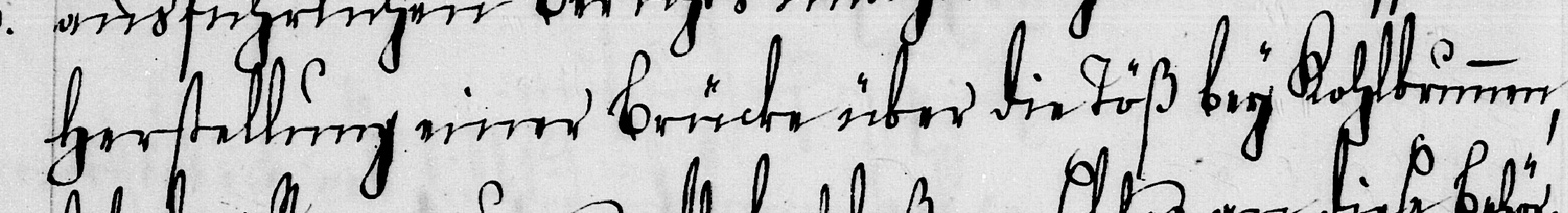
Herstellung einer Brücke über die Töß bey Kohlbrunn¬
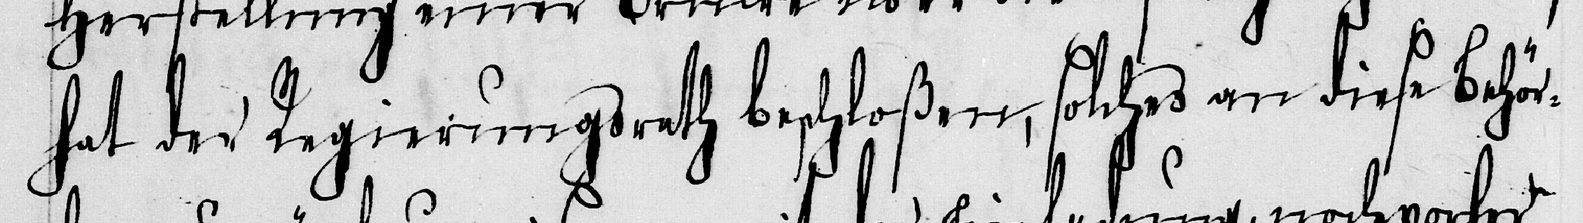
hat der Regierungsrath beschloßen, solches an diese Behö¬
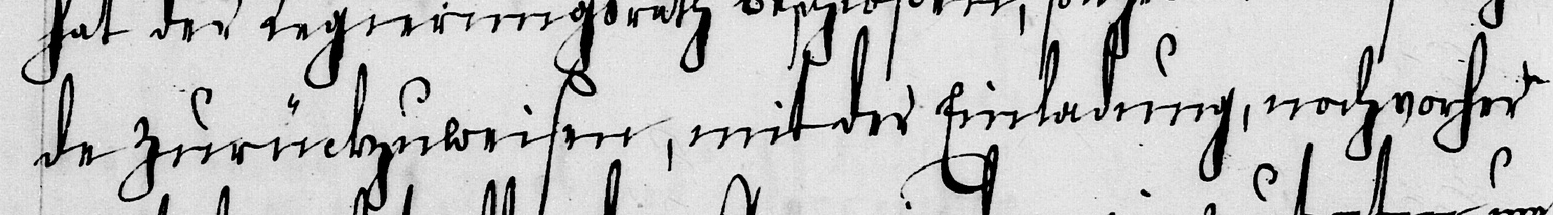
rde zurückzuweisen, mit der Einladung, noch vorher
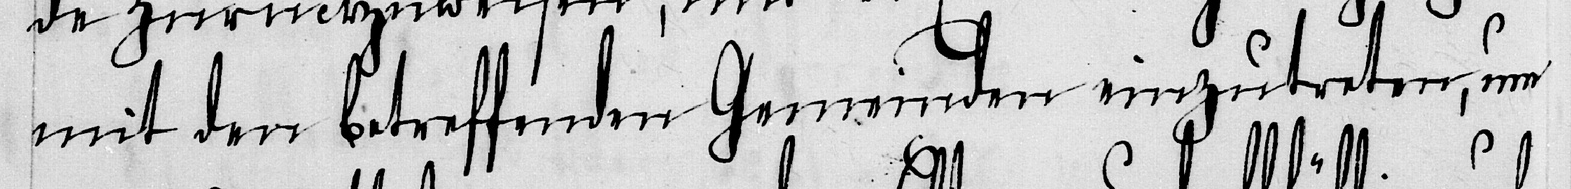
mit den betreffenden Gemeinden einzutreten, um
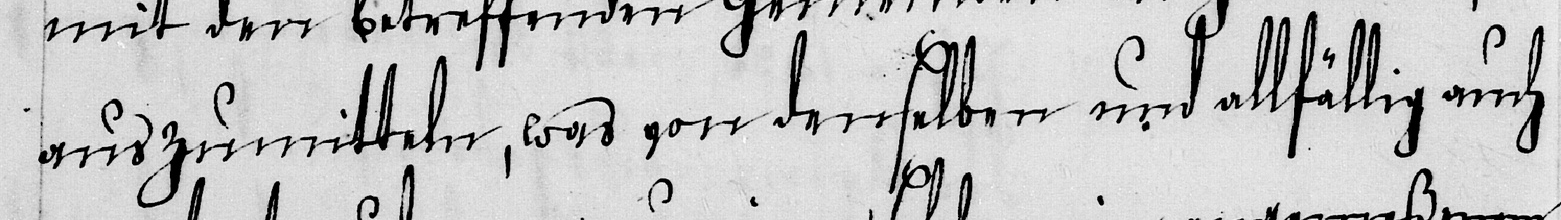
auszumitteln, was von denselben und allfällig auch
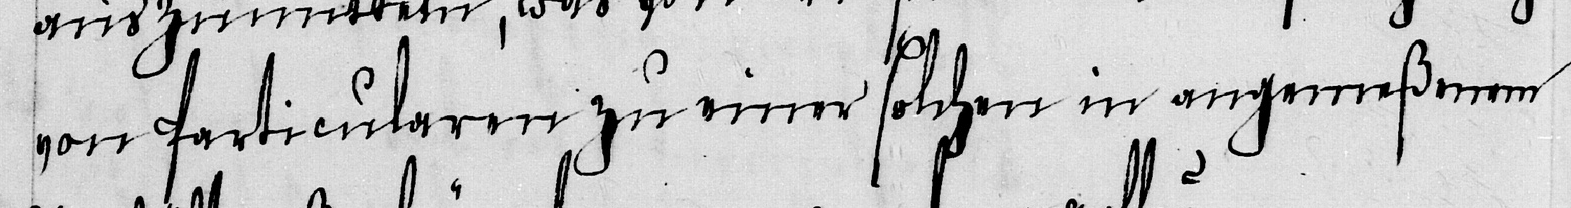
von Particularen zu einer solchen in angemeßenem
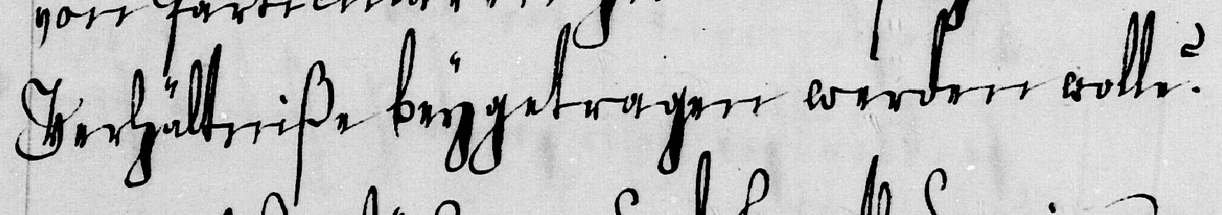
Verhältniße beygetragen werden wolle?
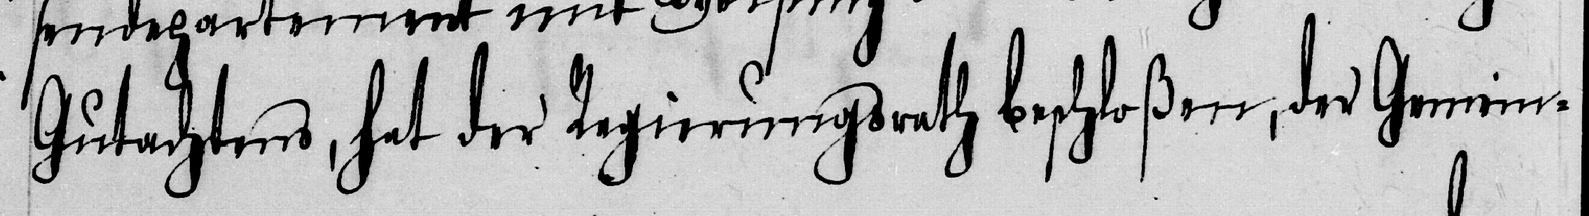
Gutachtens, hat der Regierungsrath beschloßen, der Gemein
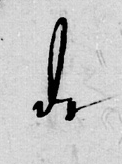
die
